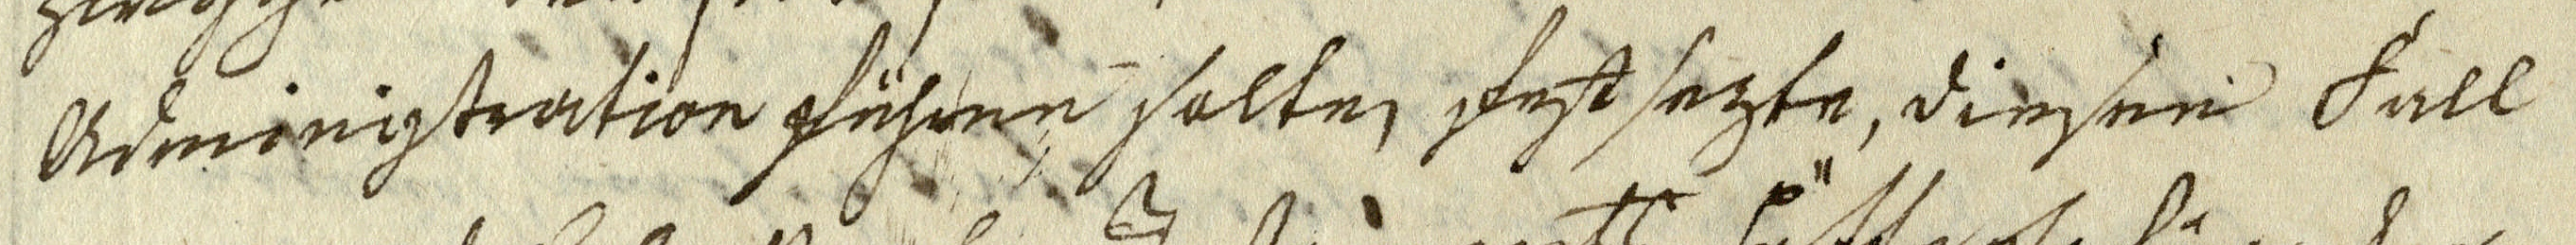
Administration führen solte, fest sezte, diesen Fall
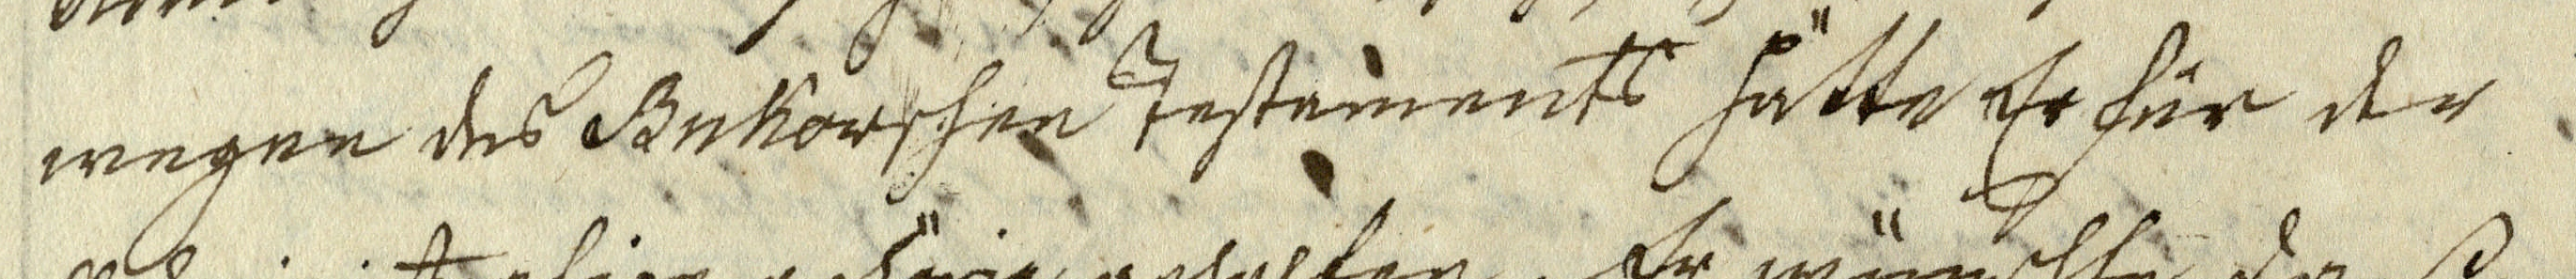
wegen des Bukowschen Testaments hätte Er für der
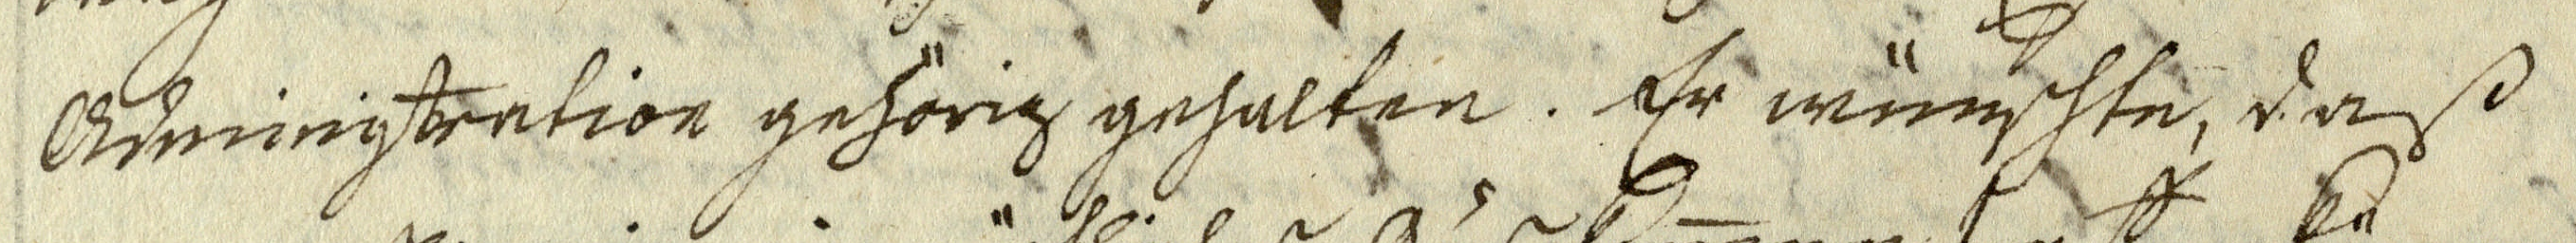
Administration gehörig gehalten. Er wünschte, daß
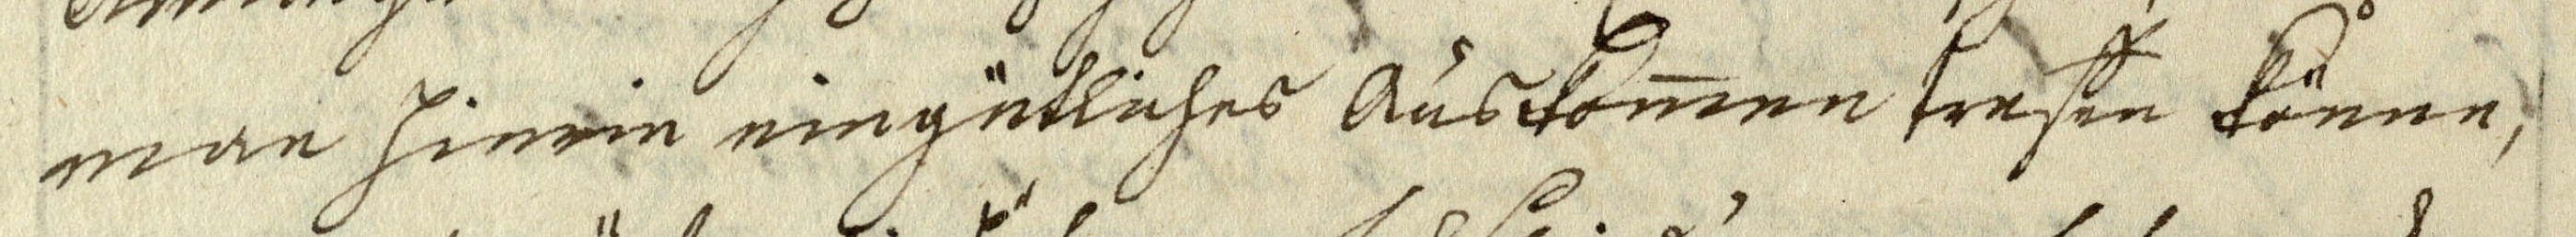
man hierin ein gütliches Auskomen treffen könne,
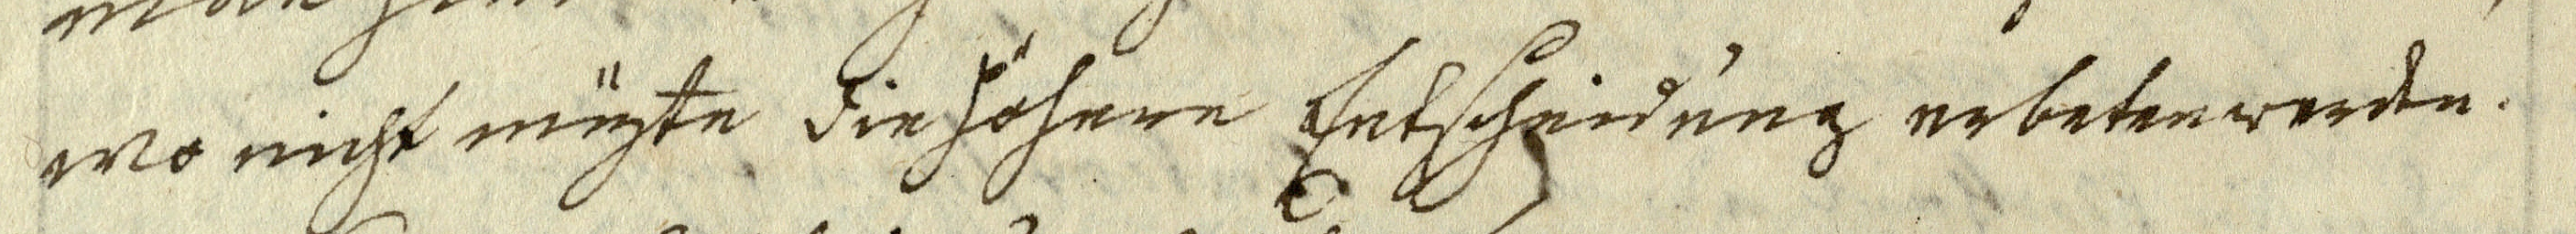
wo nicht müste die höhere Entscheidung erbeten werden.
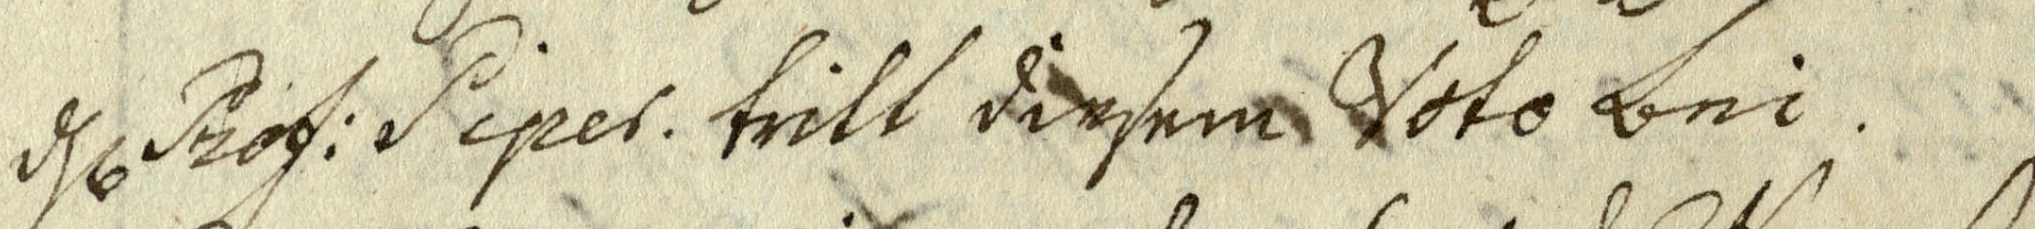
dh Prof. Piper. tritt diesem voto bei.
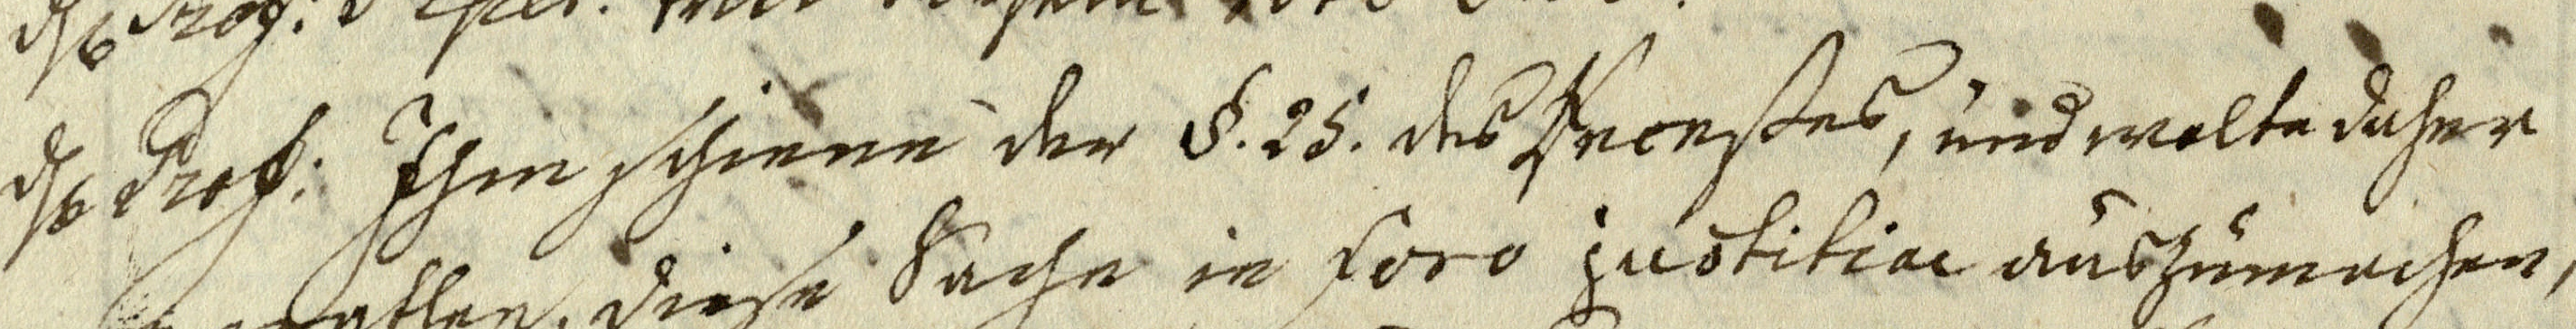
dh Prof. Ihm schiene der § 25. des Receßes, und wolte daher
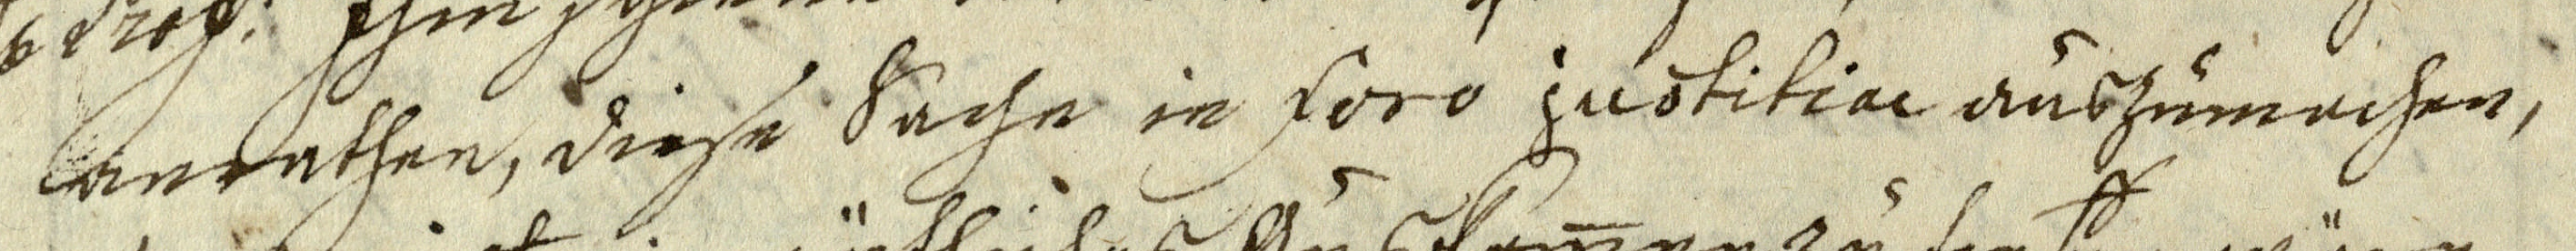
anrathen, diese Sache in Foro justitiae auszumachen,
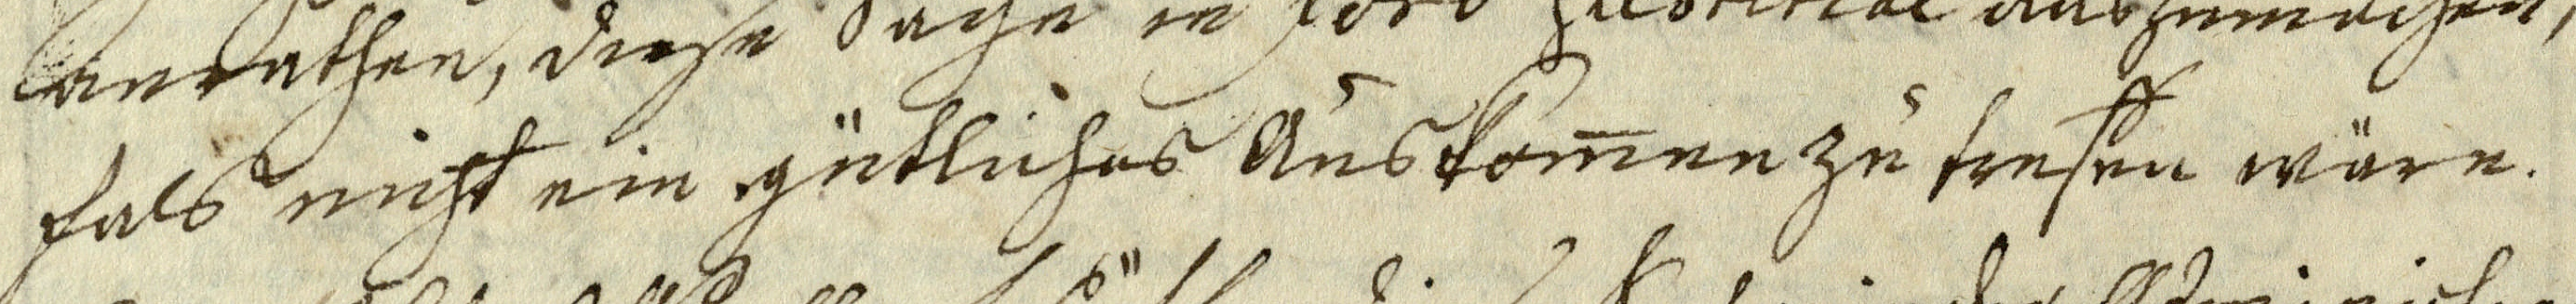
fals nicht ein gütliches Auskomen zu treffen wäre.
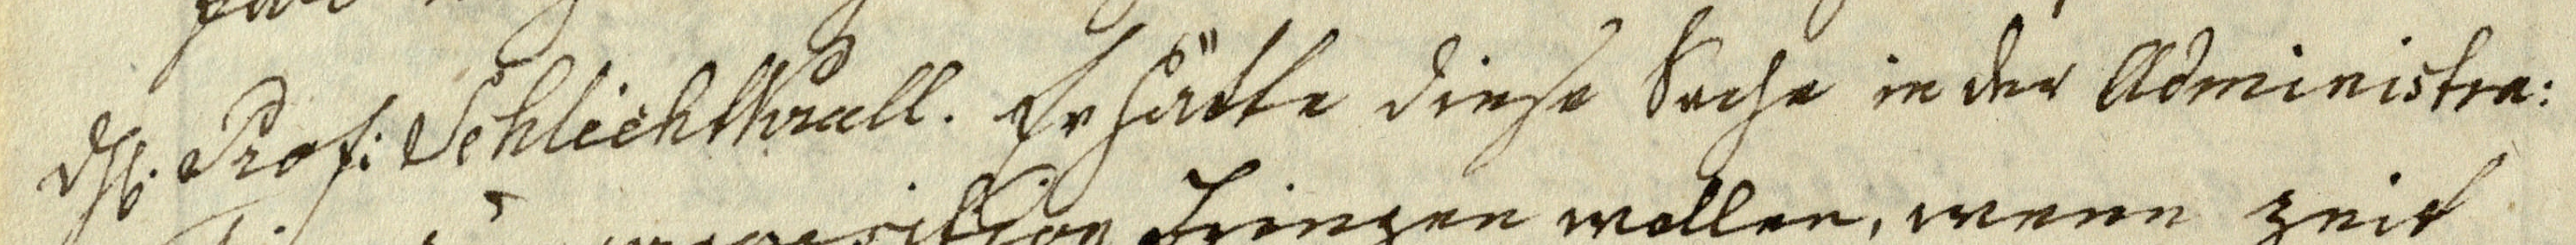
dh Prof. Schlichtkrull. Er hätte diese Sache in der Administra¬
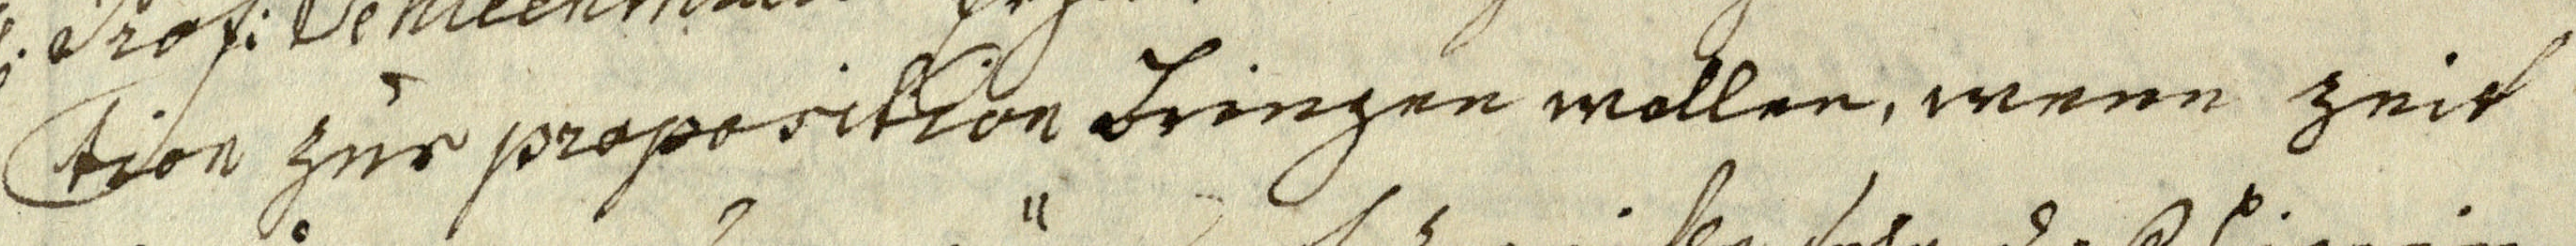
tion zur proposition bringen wollen, wenn zeit
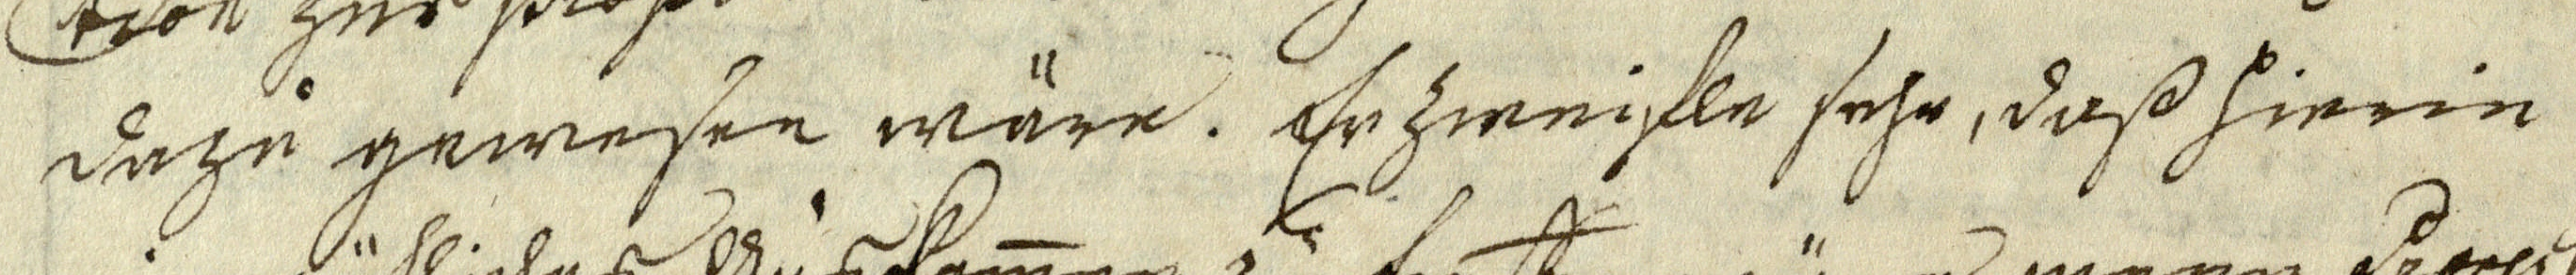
dazu gewesen wäre. Er zweifle sehr, daß hierin
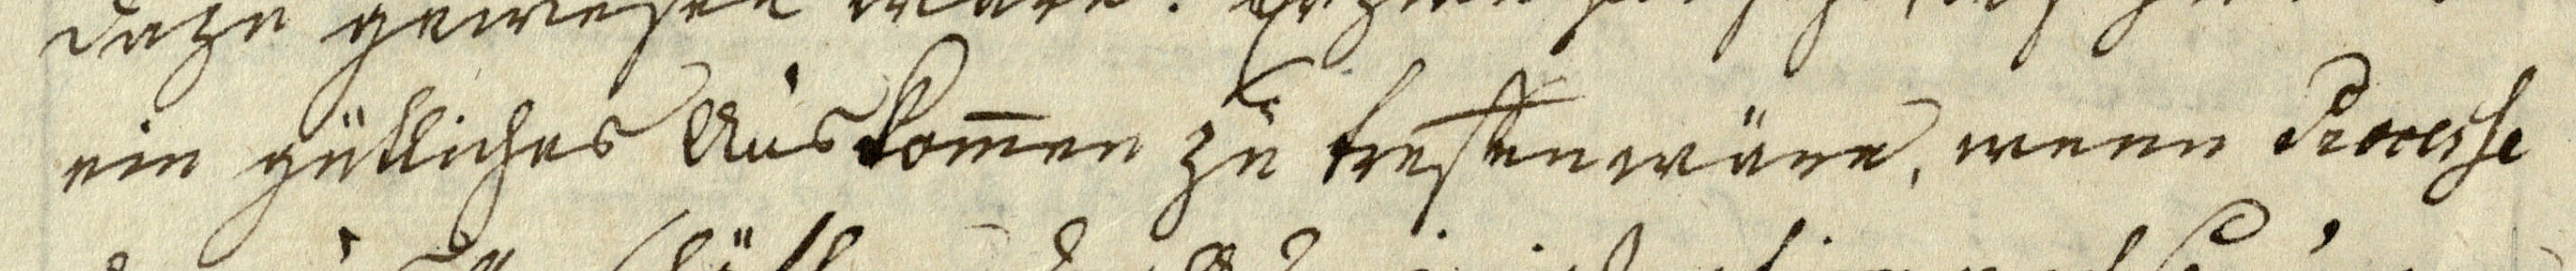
ein gütliches Auskomen zu treffen wäre, wenn Processe
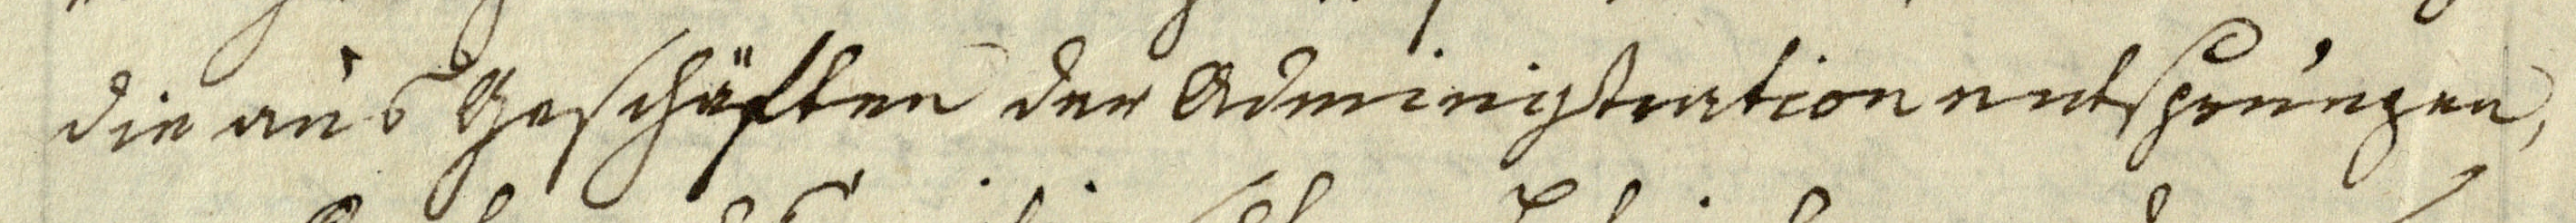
die aus Geschäften der Administration entsprungen,
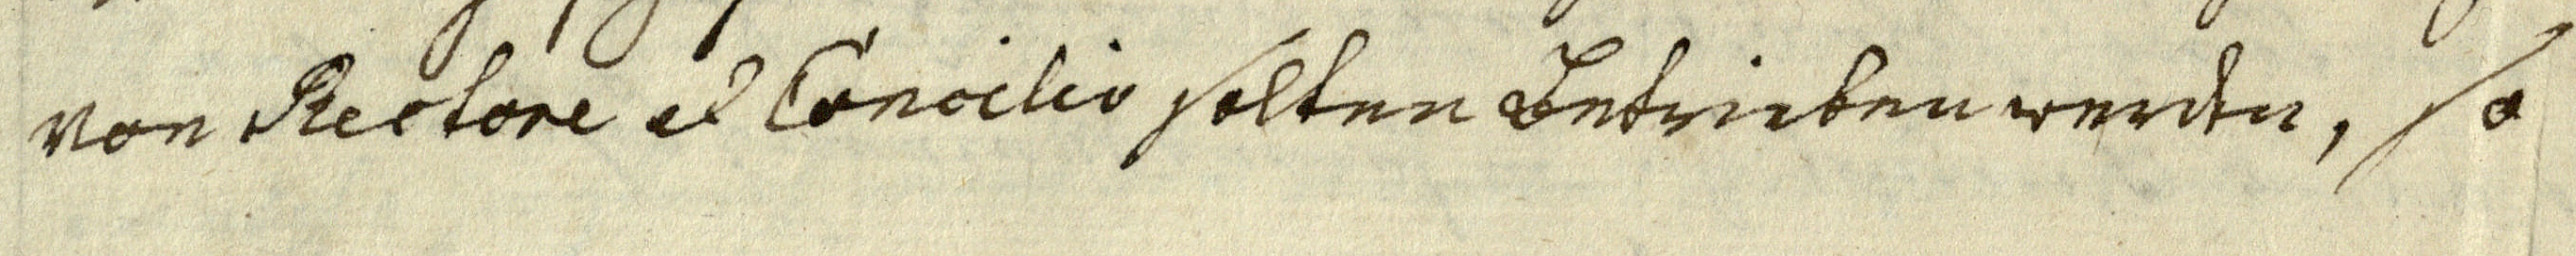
von Rectore et Concilio solten betrieben werden, so
